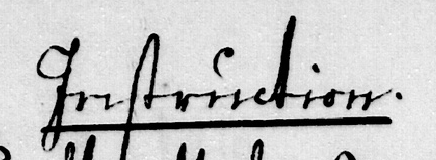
Instruction.
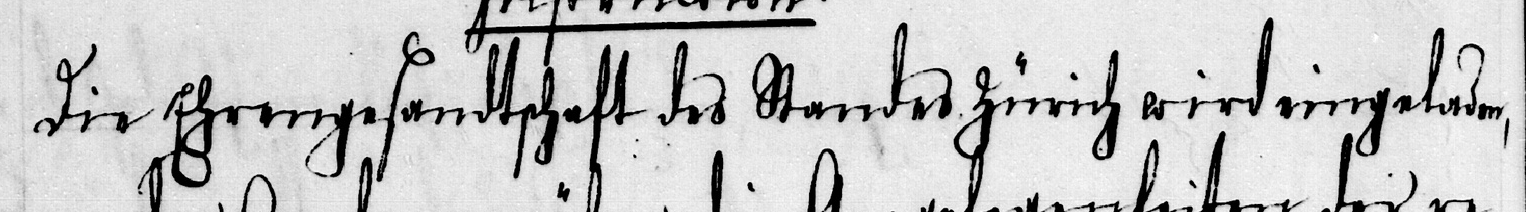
Die Ehrengesandtschaft des Standes Zürich wird eingeladen,
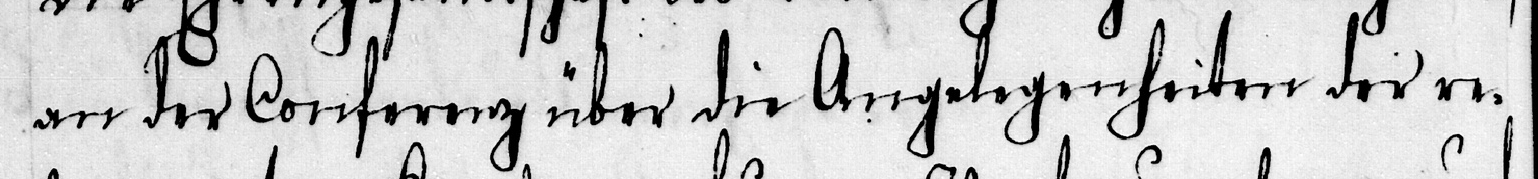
an der Conferenz über die Angelegenheiten der re¬
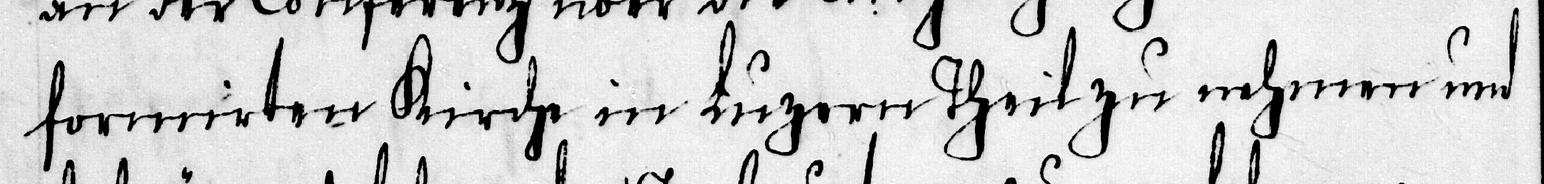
formirten Kirche in Luzern Theil zu nehmen und
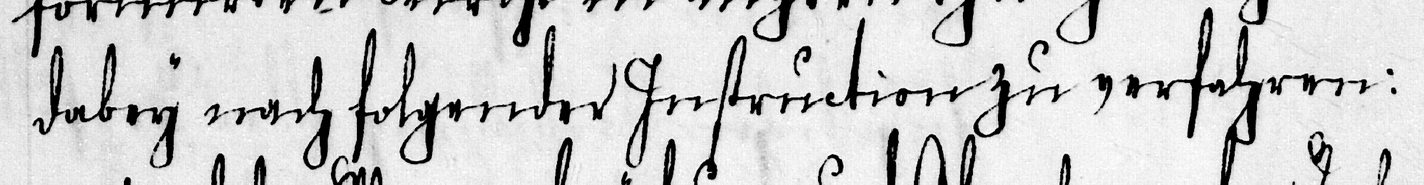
dabey nach folgender Instruction zu verfahren:
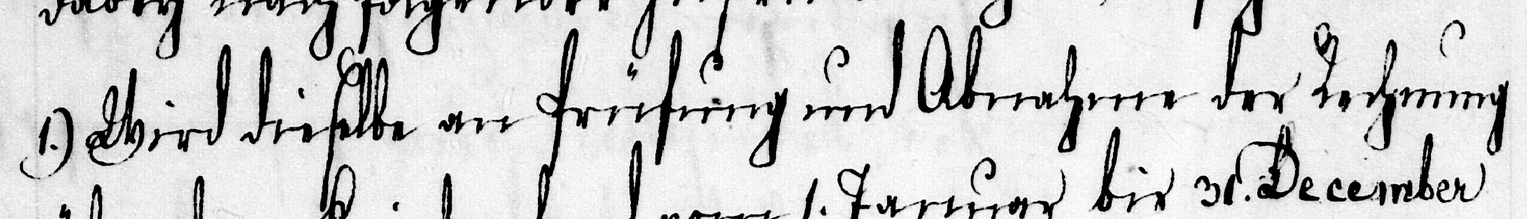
1.) Wird dieselbe an Prüfung und Abnahme der Rechnung
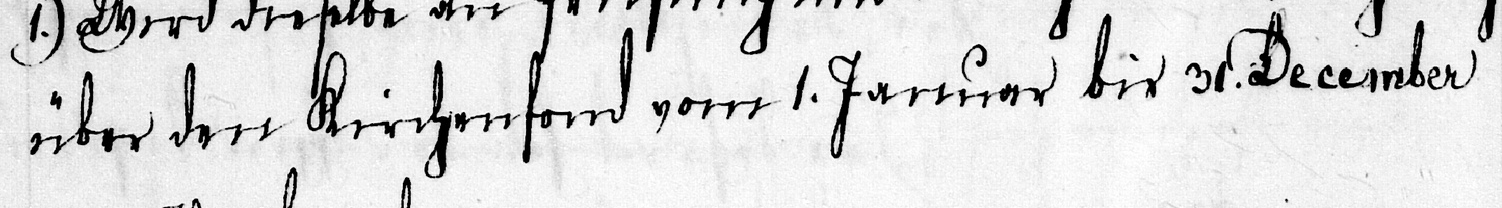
über den Kirchenfond vom 1. Januar bis 31. December
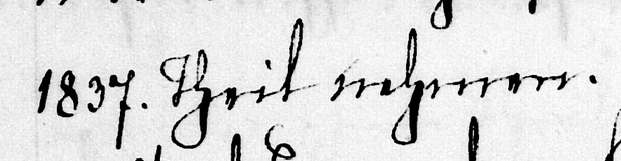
1837. Theil nehmen.
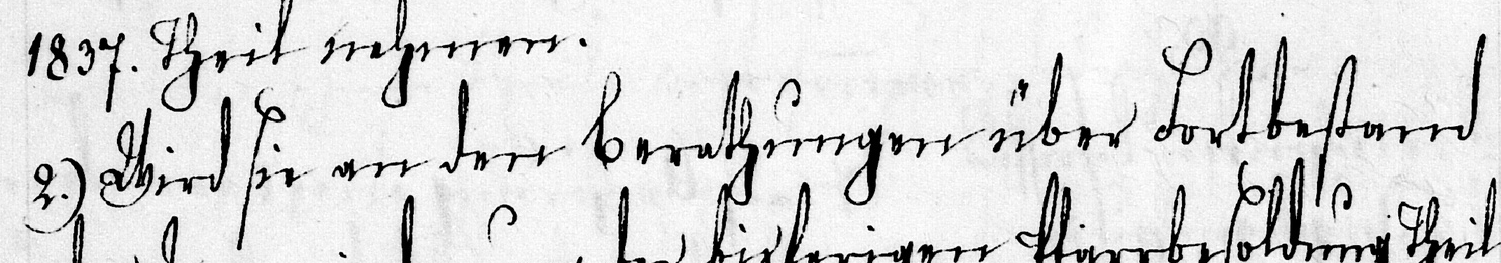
2.) Wird sie an den Berathungen über Fortbestand
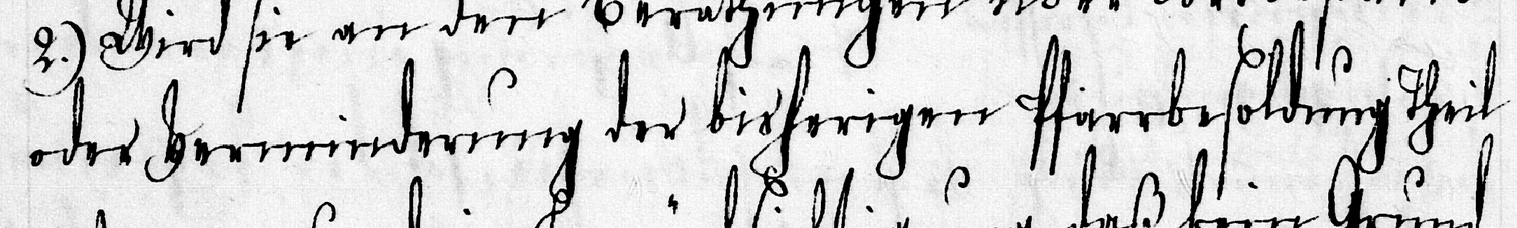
oder Verminderung der bisherigen Pfarrbesoldung Theil
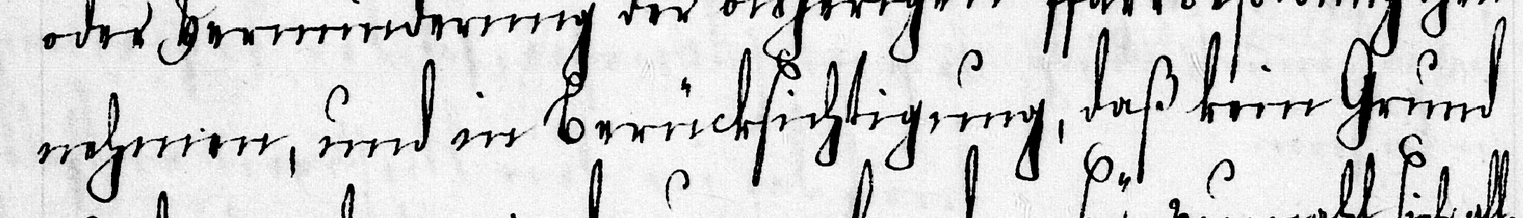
nehmen, und in Berücksichtigung, daß kein Grund
